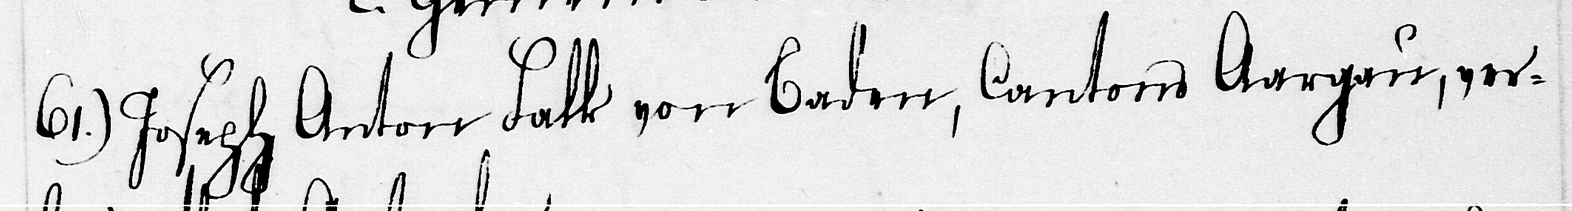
61.) Joseph Anton Falk von Baden, Cantons Aargau, ver¬
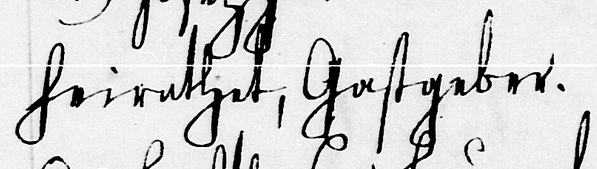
heirathet, Gastgeber.
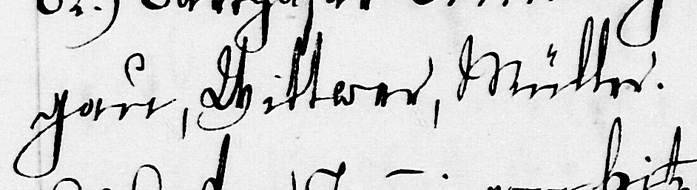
gau, Wittwer, Müller.
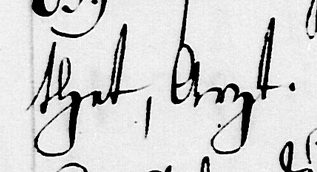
thet, Arzt.
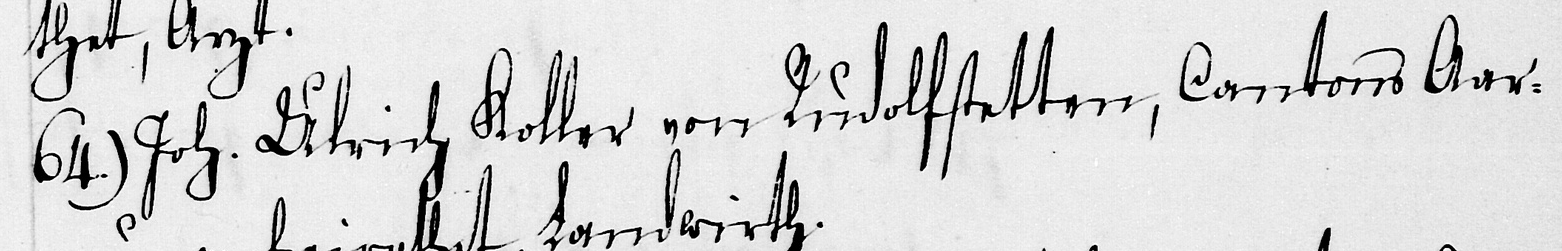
64.) Joh. Ulrich Koller von Rudolfstetten, Cantons Aar¬
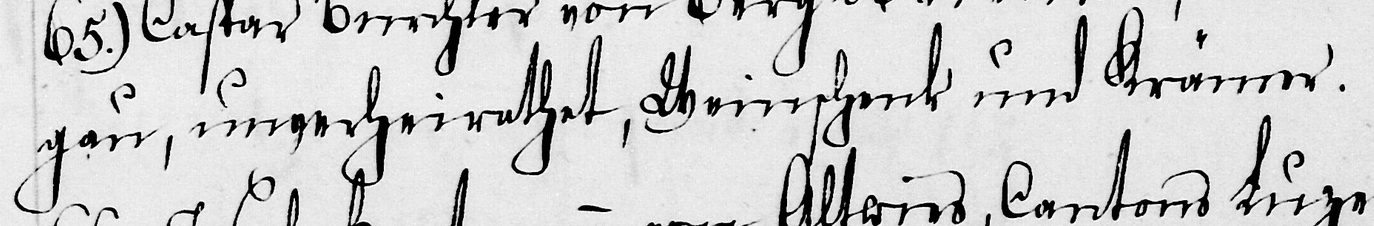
gau, unverheirathet, Weinschenk und Krämer.
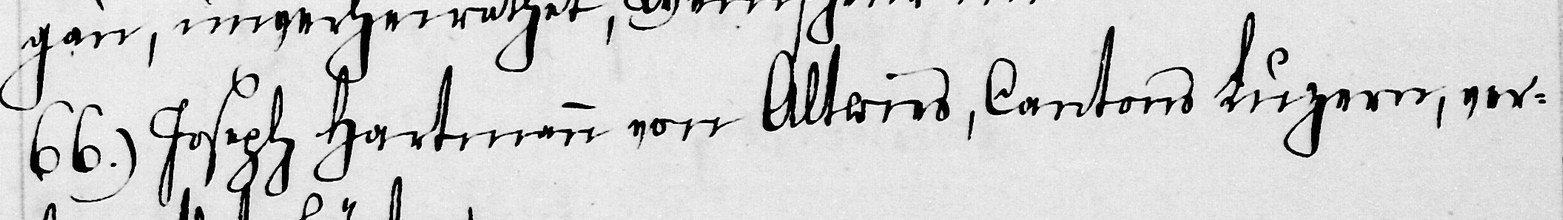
66.) Joseph Hartmann von Altwies, Cantons Luzern, ver¬
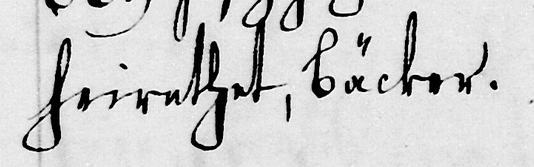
heirathet, Bäcker.
